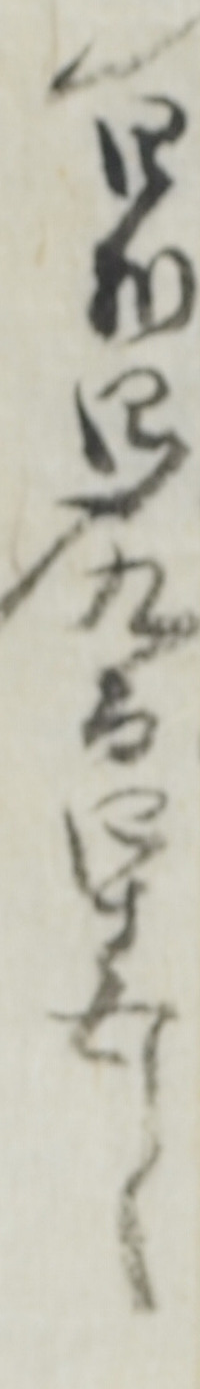四拾弐貫九百四拾五文
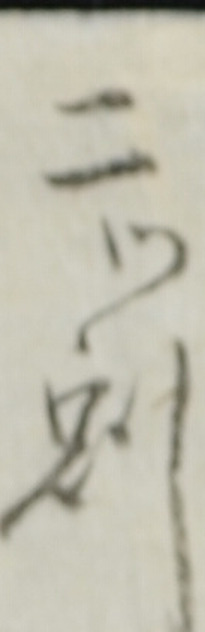二つ別
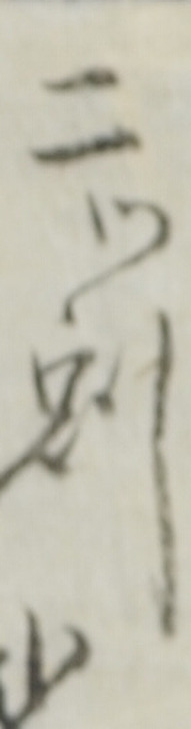二つ別
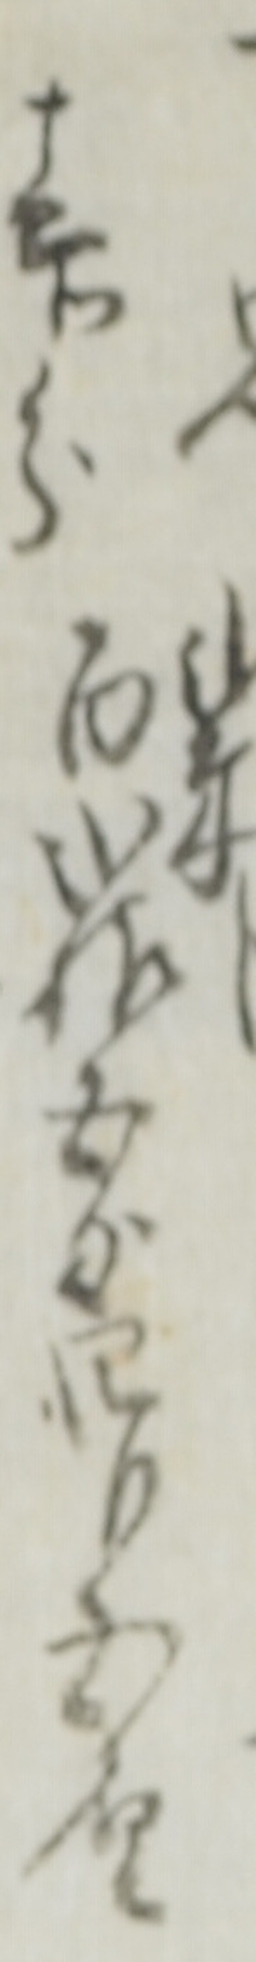春分百弐拾五匁四分五里
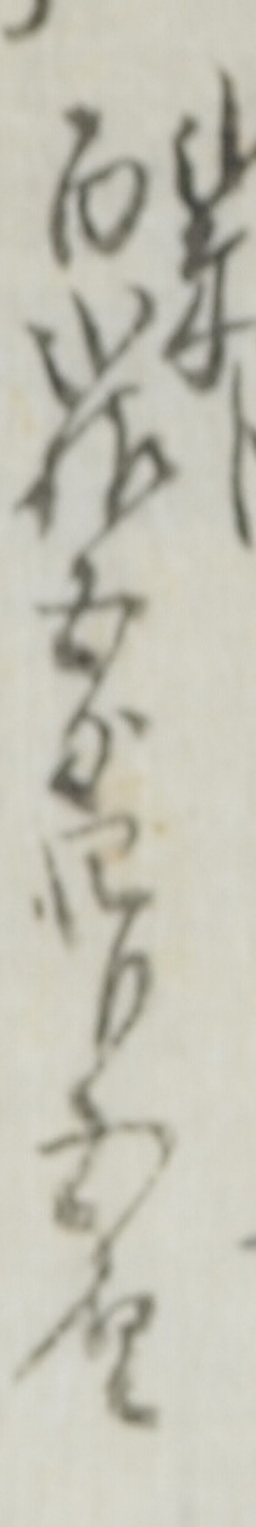春分百弐拾五匁四分五里
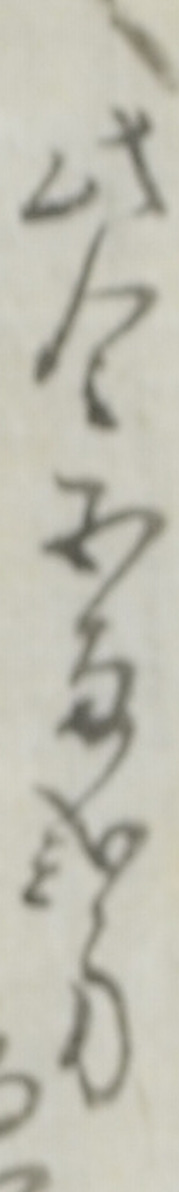此金五両弐分
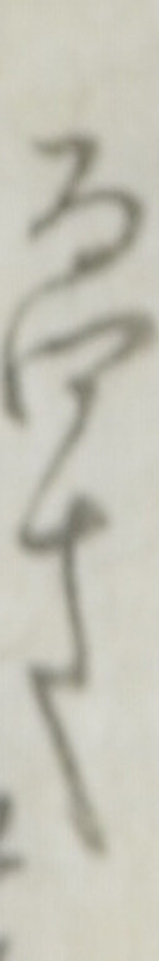百四十文
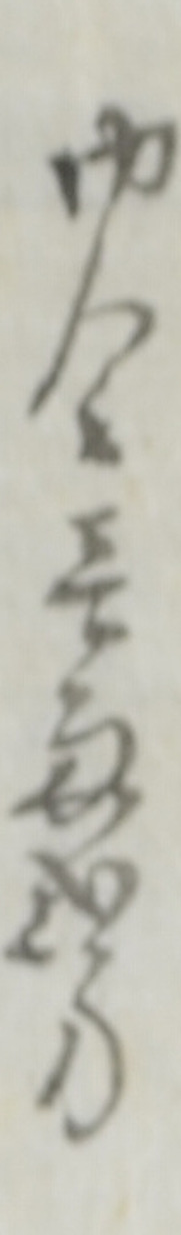此金五両弐分

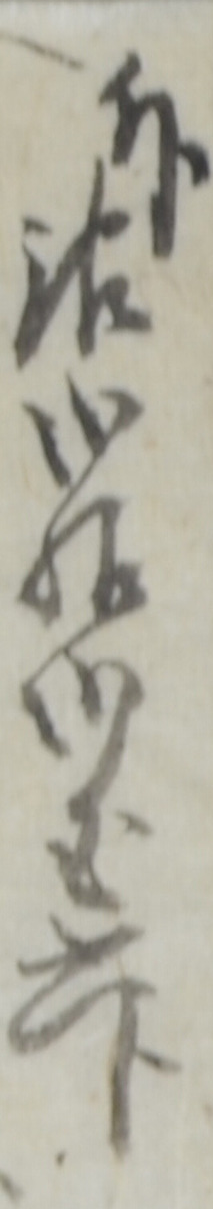銀弐拾弐匁六分
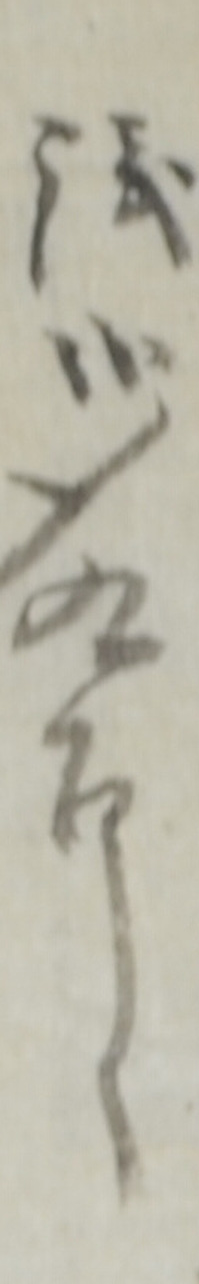銭弐貫九百文宛
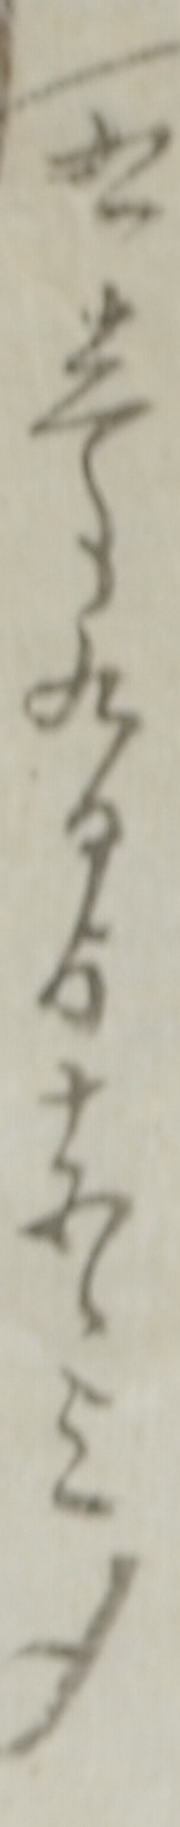右十二月九日ゟ十五日迄〆

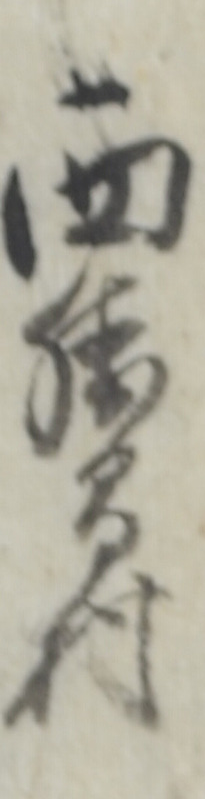西勝間村
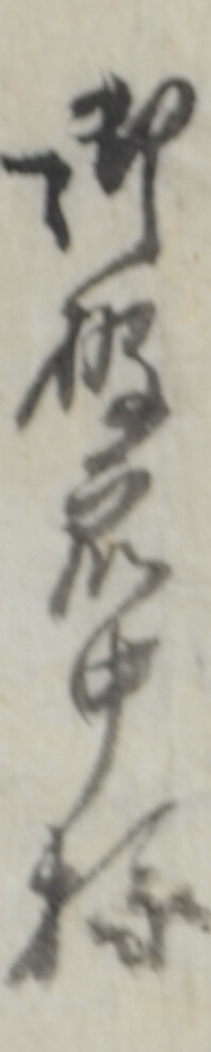御役衆中様
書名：（金銭書上控）
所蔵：伊那市立高遠町図書館・合同会社AMANE
